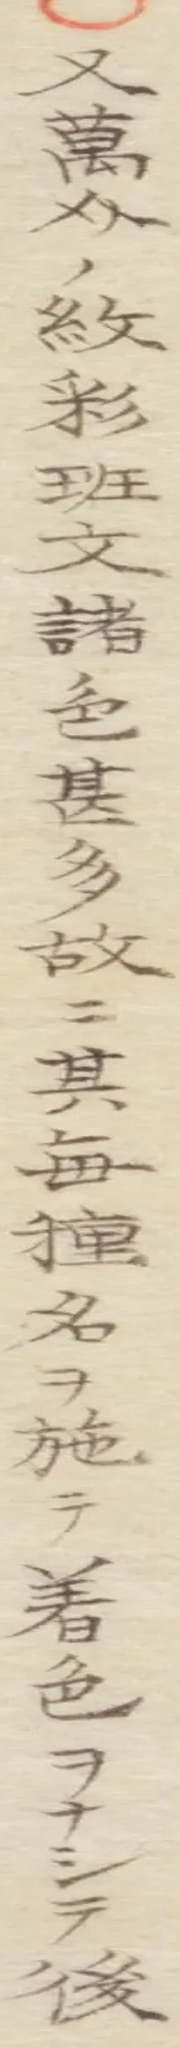○又萬介ノ紋彩班文諸色甚多故其毎種名ヲ施テ着色ヲナシテ後
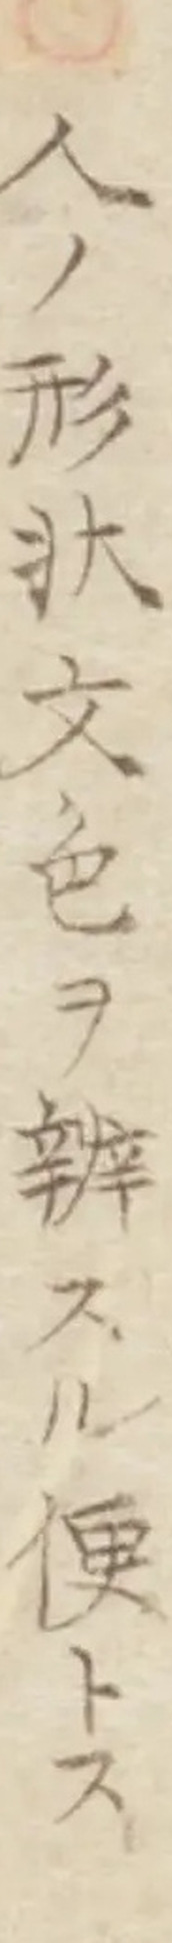人ノ形状文色ヲ辨スル便トス
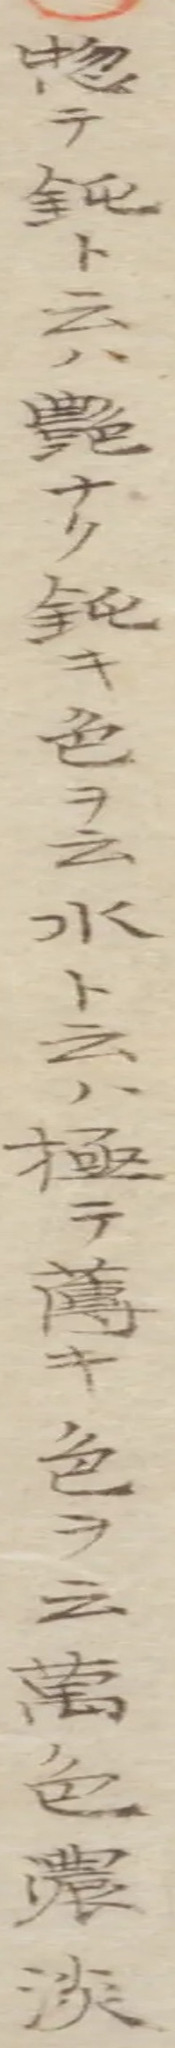○惣テ鈍トイフハ艶ナリ鈍キ色ヲイフ水トイフハ極テ薄キ色ヲイフ萬色濃淡
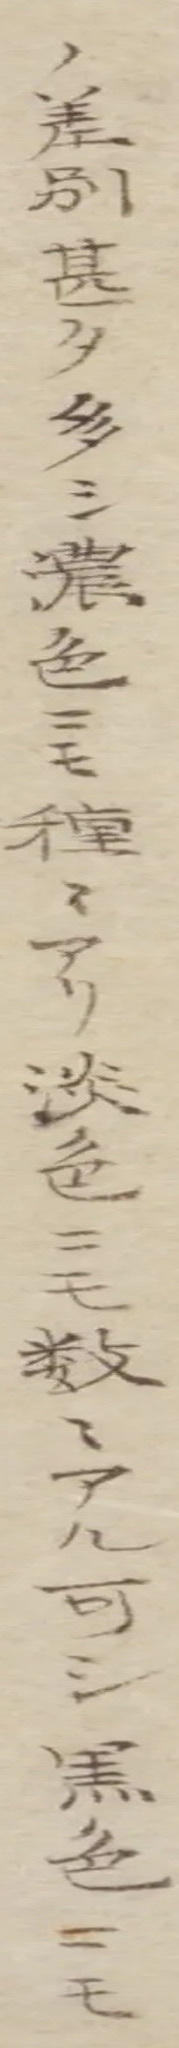ノ差別甚タ多シ濃色ニモ種ゝアリ淡色ニモ数ゝアル可シ黒色ニモ
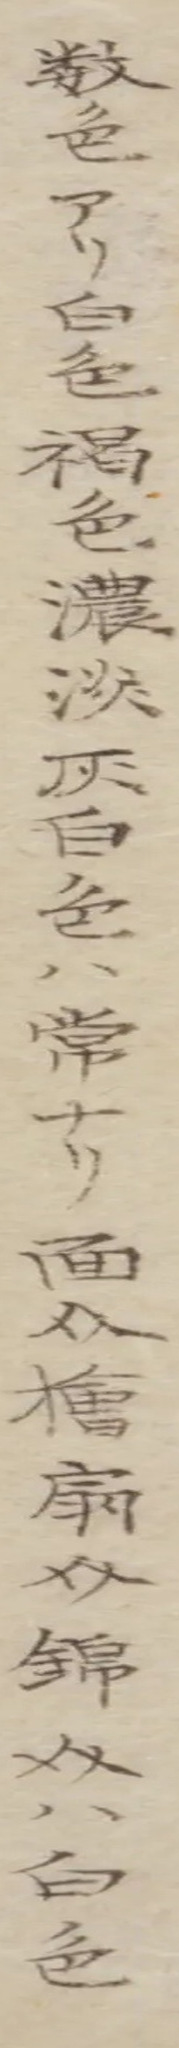数色アリ白色褐色濃淡灰白色ハ常ナリ面介檜扇介面介ハ白色
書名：目八譜. 第１巻
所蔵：国立国会図書館 National Diet Library, JAPAN
